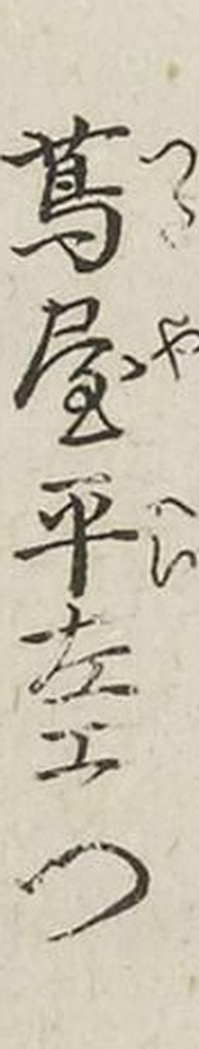蔦屋平左ェ門
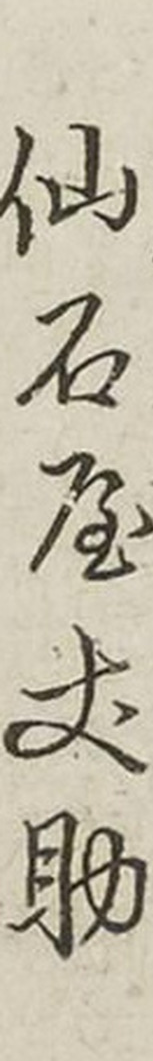仙石屋丈助
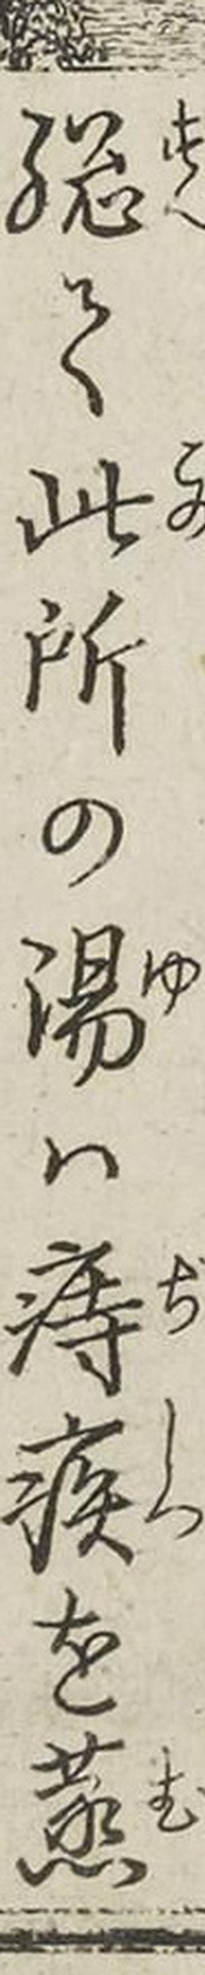総て此所の湯は痔疾を蒸
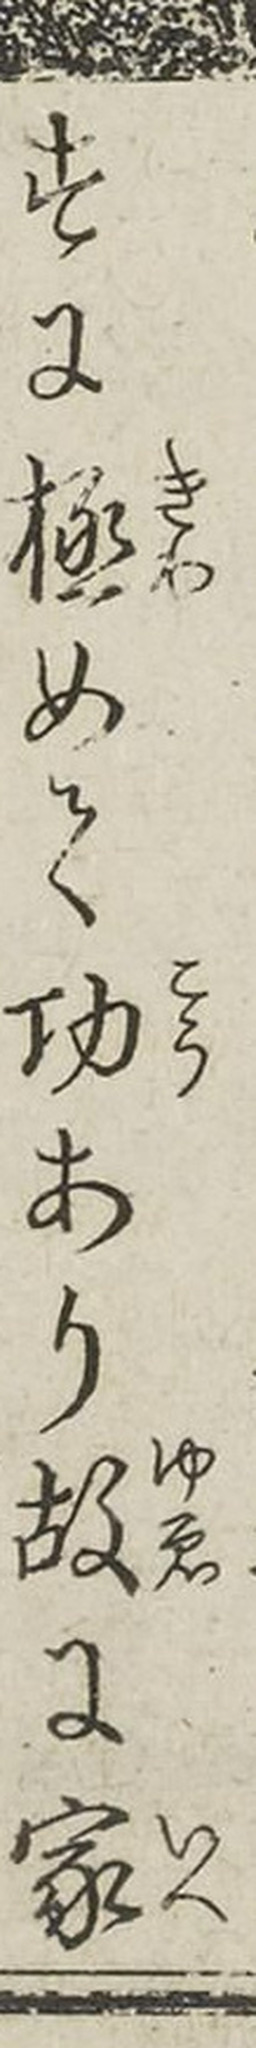すに極めて功あり故に家
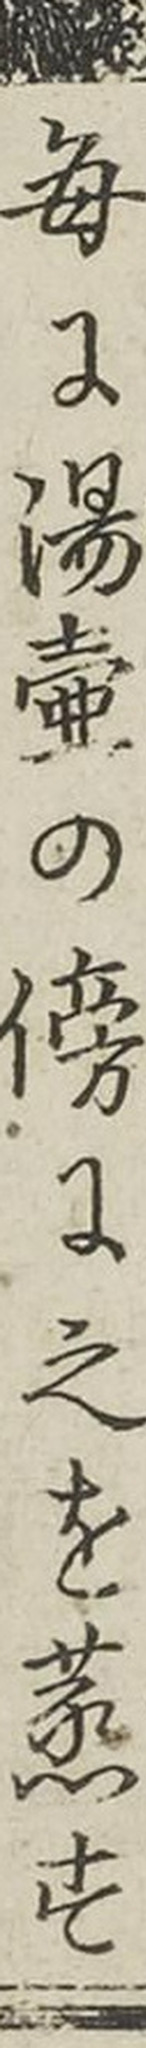毎に湯壷の傍に之を蒸す

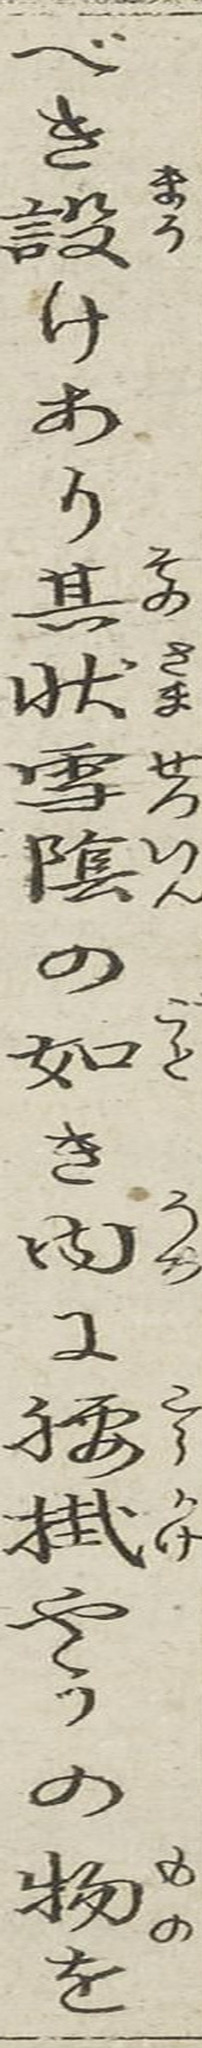べき設けあり其状雪陰の如き内に腰掛やうの物を
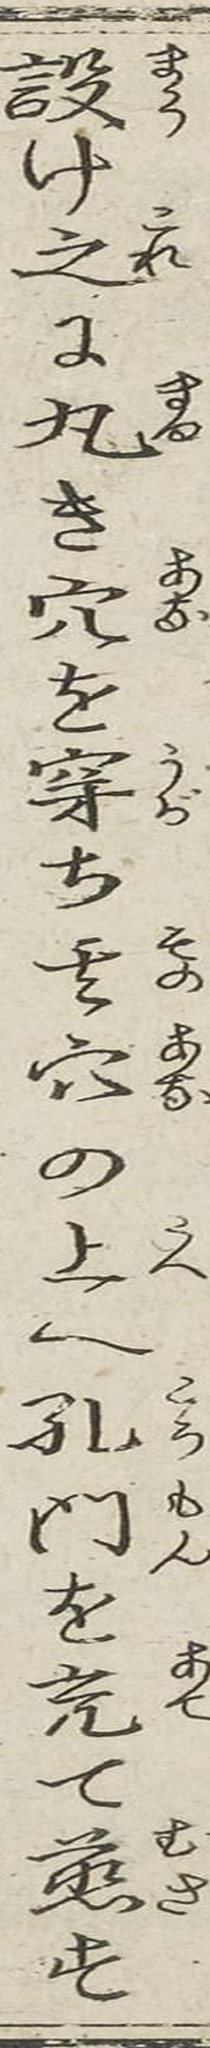設け之に丸き穴を穿ち其穴の上へ孔門を充て蒸す
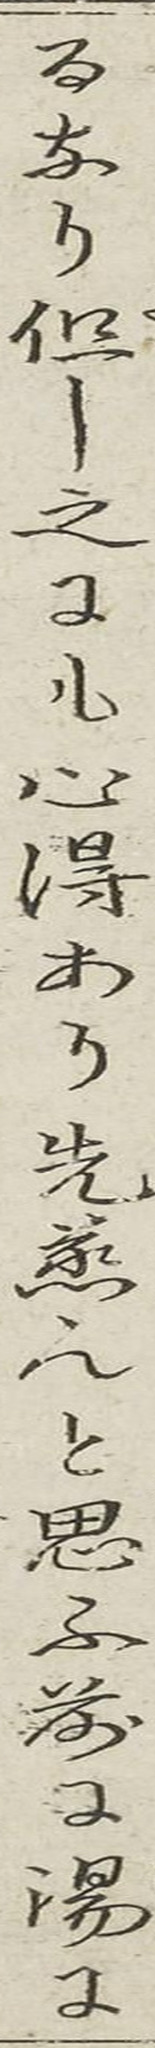るなり但し之にも心得あり先蒸んと思ふ前に湯に
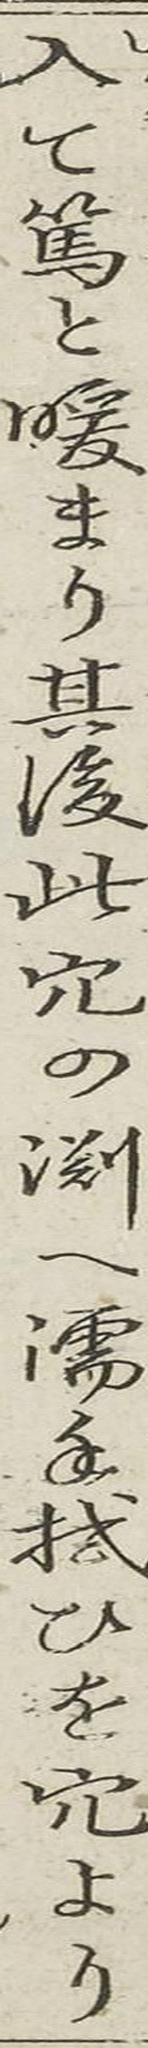入て篤と暖まり其後此穴の渕へ濡手拭ひを穴より
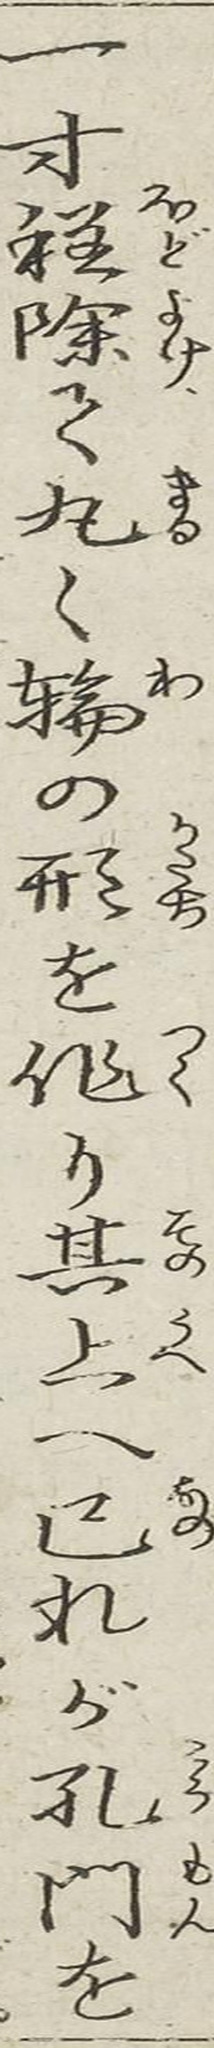一寸程徐て丸く輪の形を作り其上へ己れが孔門を
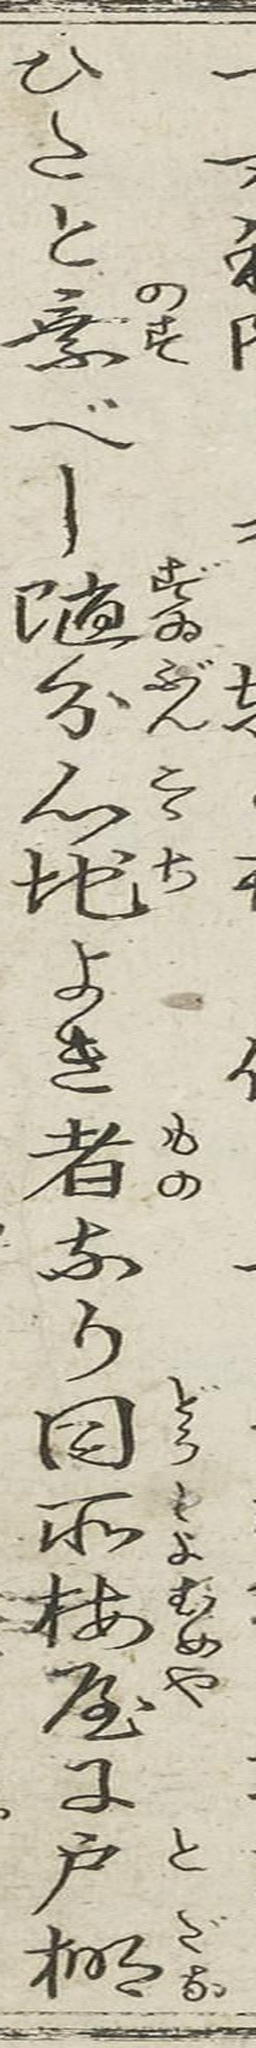ひたと蒸べし随分心地よき者なり同所梅屋に戸棚
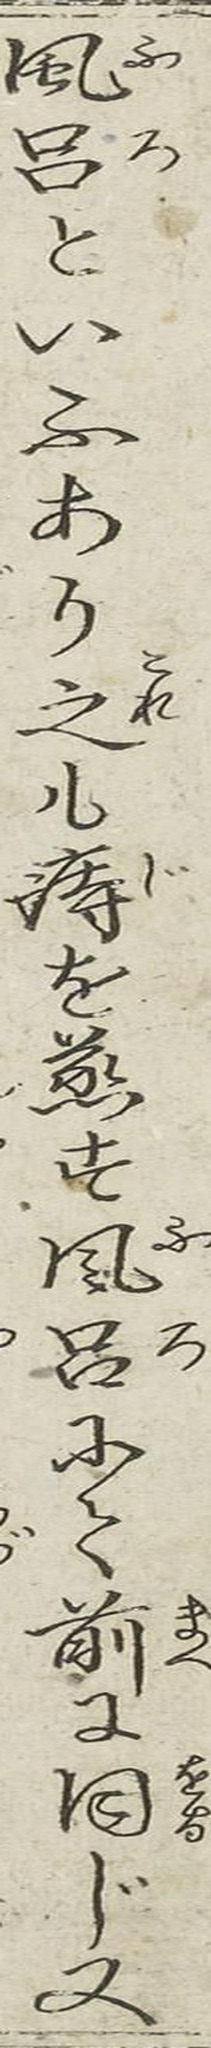風呂といふあり之も痔を蒸す風呂にて前に同じ又
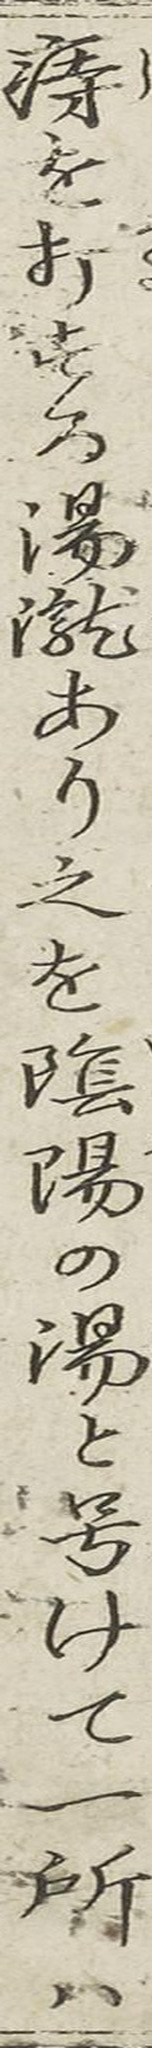痔を打する湯瀧あり之を陰陽の湯と号けて一所は
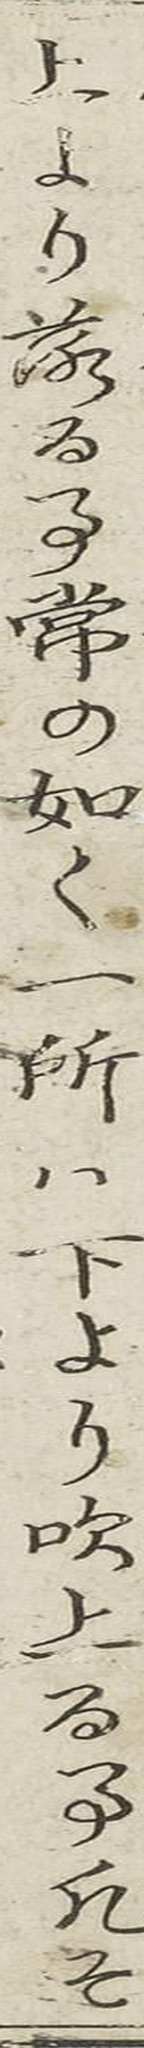上より落る事常の如く一所は下より吹上る事凡そ
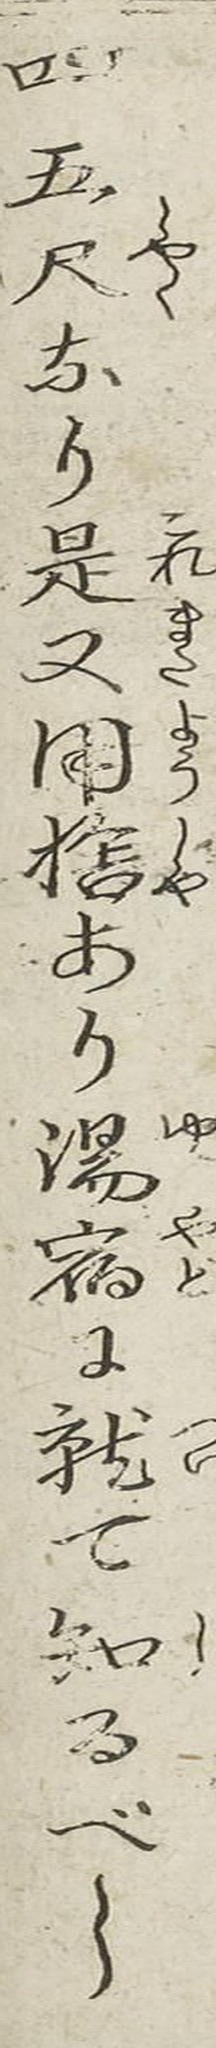四五尺なり是又用捨あり湯宿に就て知るべし
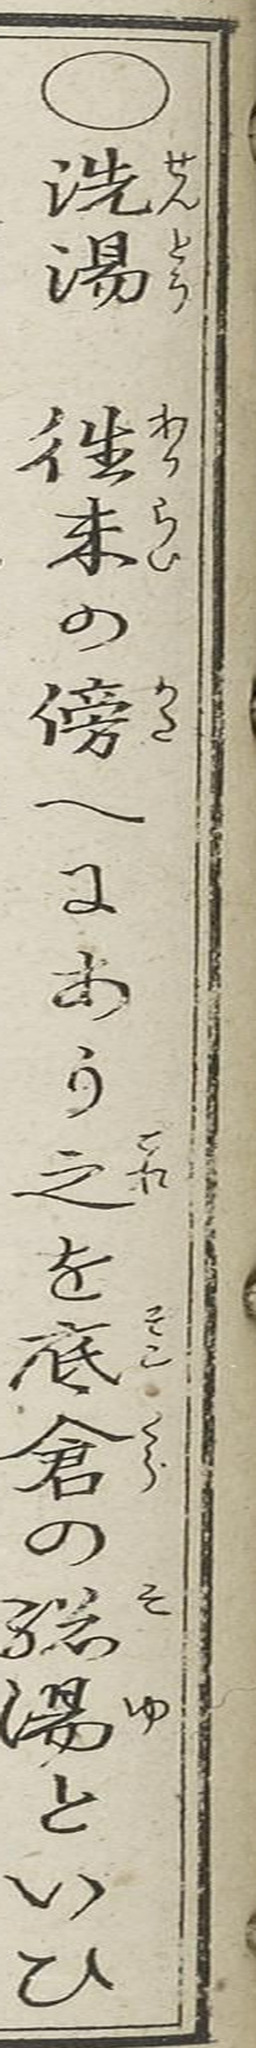○洗湯往来の傍へにあり之を底倉の総湯といひ
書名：箱根温泉誌　全
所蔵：東京大学地震研究所図書室 Earthquake Research Institute Library, The University of Tokyo, JAPAN
